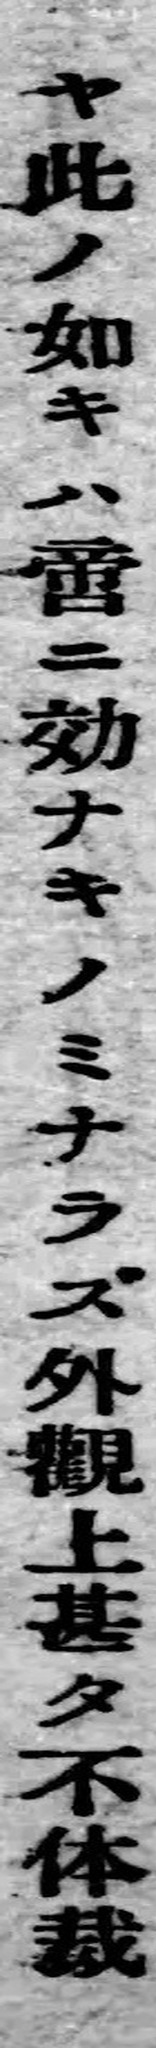や此の如きは啻に効なきのみならず外觀上甚た不体裁
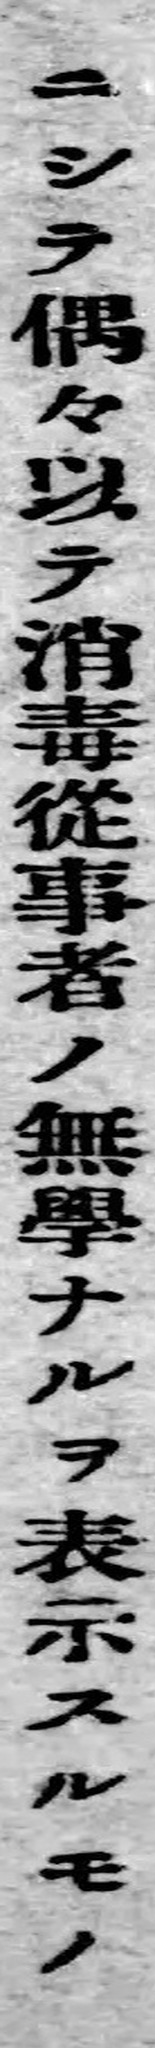にして隅々以て消毒從事者の無學なるを表示するもの
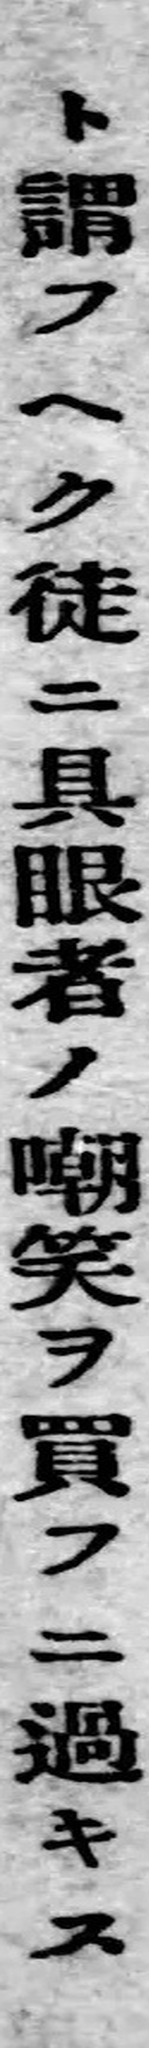と謂ふへく徒に具眼者の嘲笑を買ふに過きす
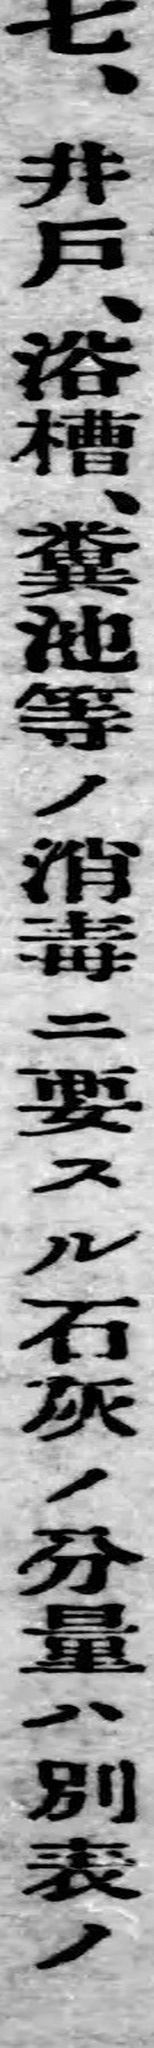七、井戸、浴槽、糞池等の消毒に要する石灰の分量は別表の
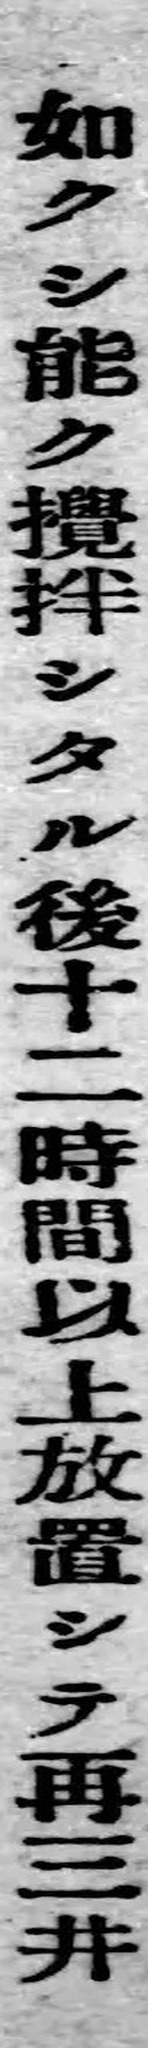如くし能く攪拌したる後十二時間以上放置して再三井
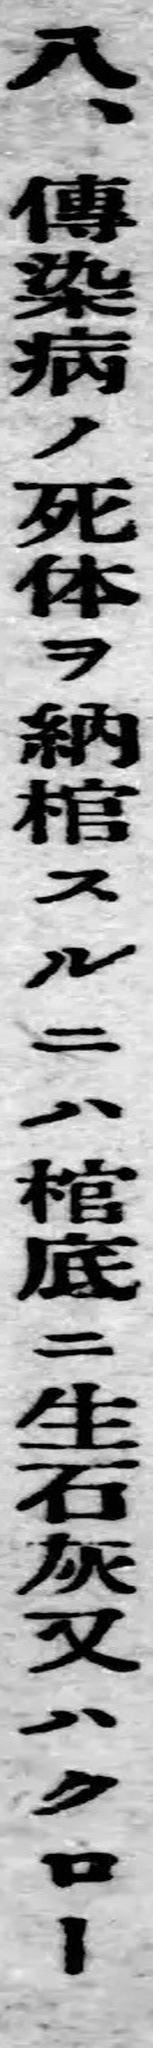八、傅染病の死体を納棺するには棺底に生石灰又はクロー
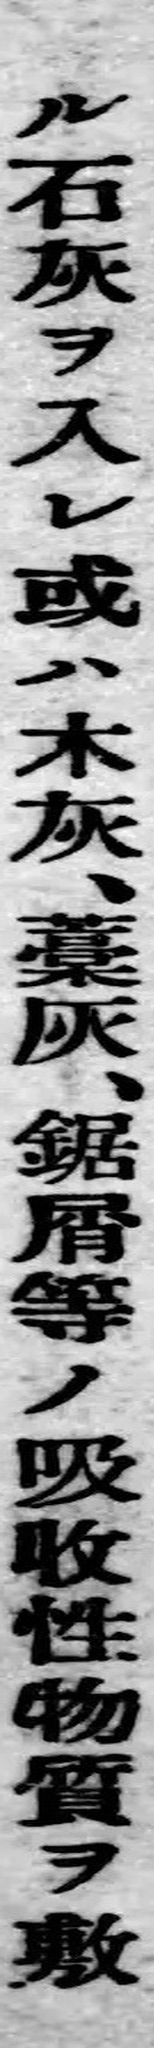ル石灰を入れ或は木灰、藁灰、鋸屑等の吸収性物質を敷
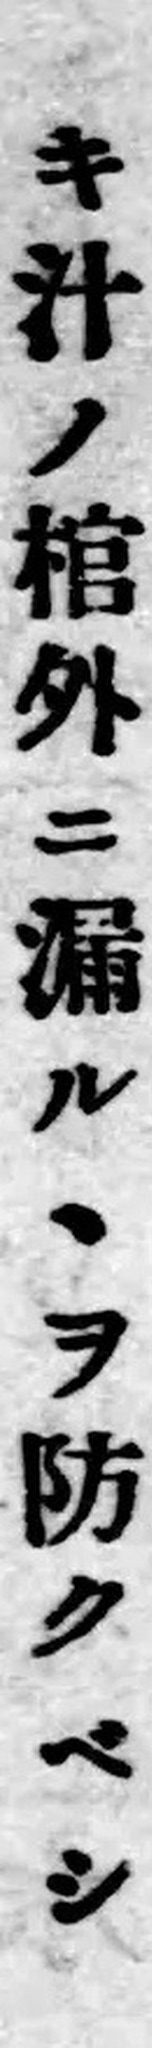き汁の棺外に漏るゝを防くべし
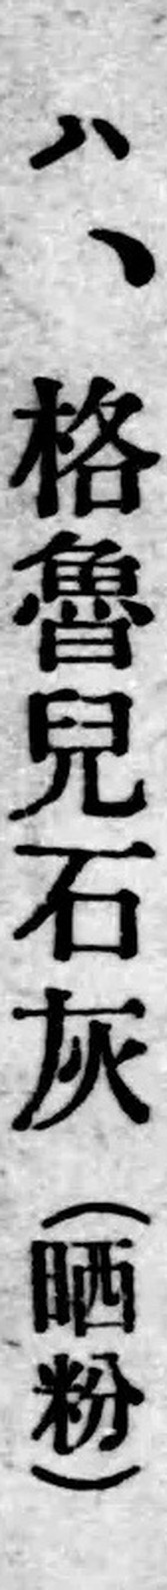ハ、格魯兒石灰(晒粉)
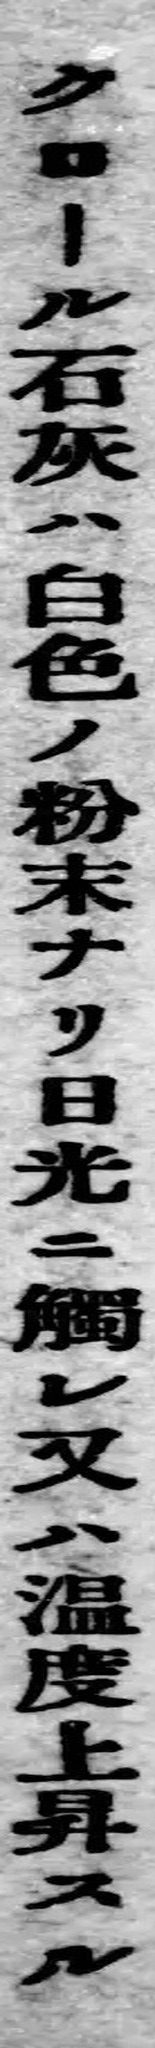クロール石灰は白色の粉末なり日光に觸れ又は温度上昇する
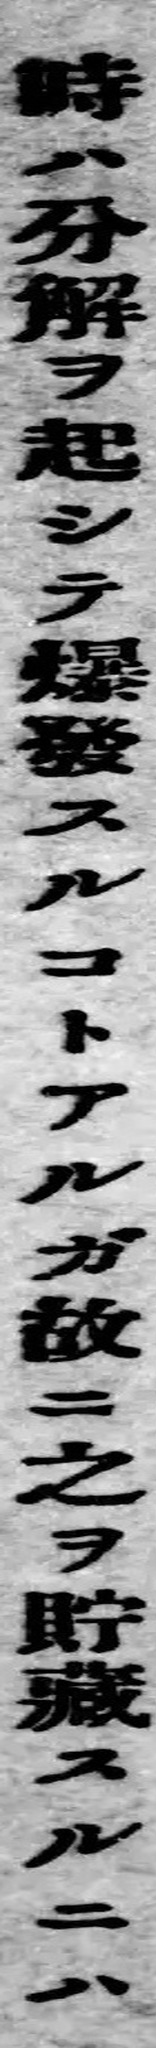時は分解を起して爆發することあるが故に之を貯藏するには

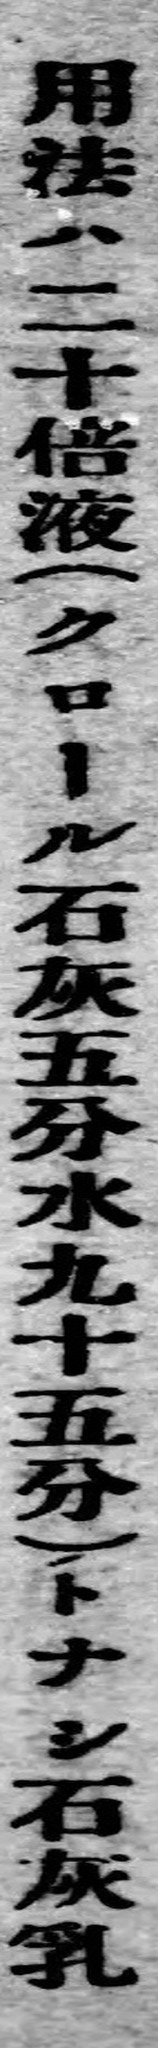用法ハ二〇倍液(クロール石灰五分水九十五分)トナシ石灰乳
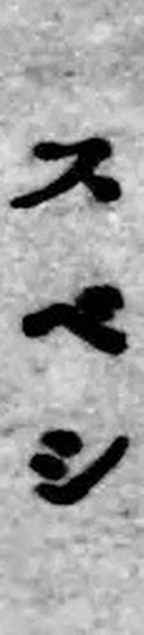スベシ
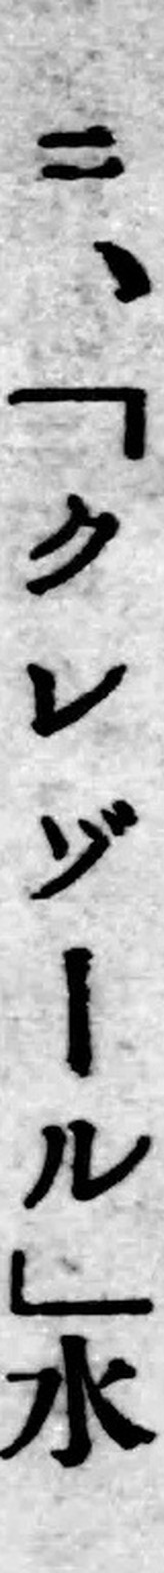二、「クレゾール」水
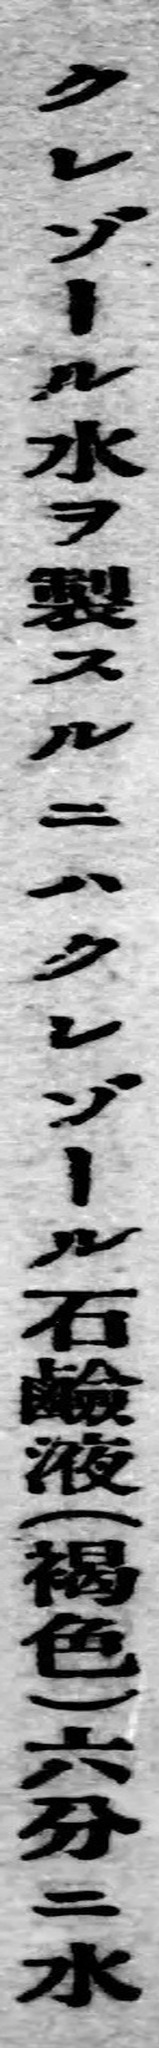クレゾール水ヲ製スルニハクレゾール石鹼液(褐色)六分ニ水
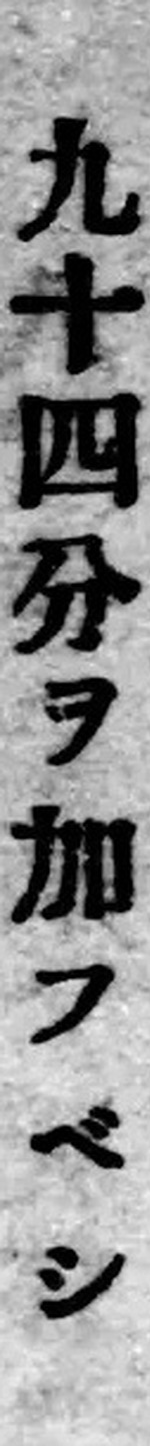九十四分ヲ加フベシ
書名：袖珍防疫必携
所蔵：国立国会図書館 National Diet Library, JAPAN
